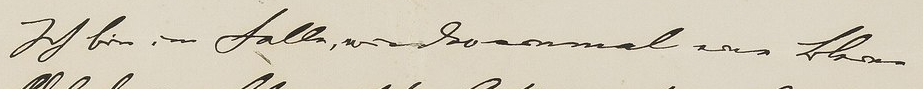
Ich bin im Falle, wiedereinmal eine kleine
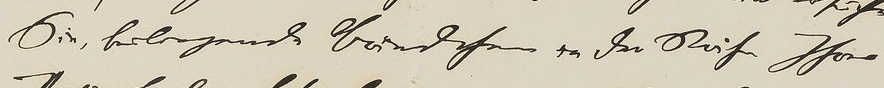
Sie, beiliegende Bändchen in der Tiefe Ihres
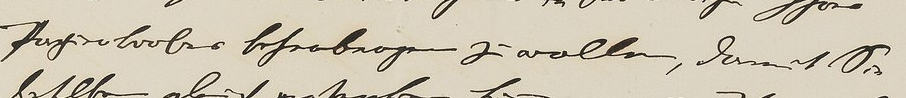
Papierkorbes beherbergen zu wollen, damit Sie
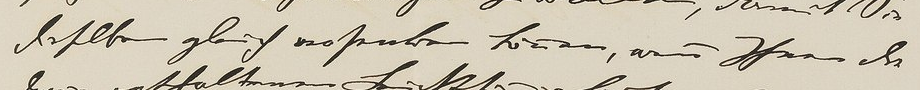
dieselben gleich versenken können, wenn Ihnen die
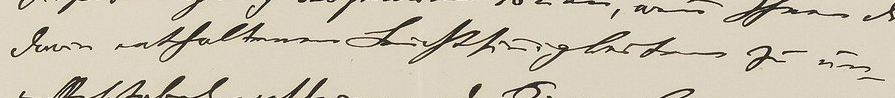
darin enthaltenen Leichtsinnigkeiten zu un-
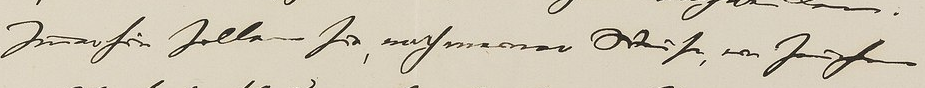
Immerhin sollen Sie, nach meiner Weise, ein Zeichen
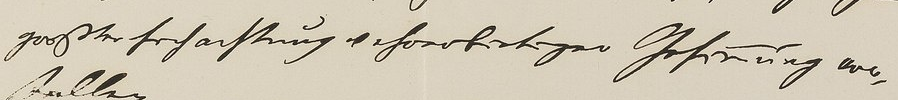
größter Hochachtung & ehrerbietiger Gesinnung vor-
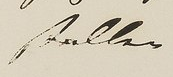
stellen
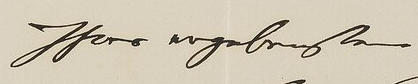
Ihres ergebensten
